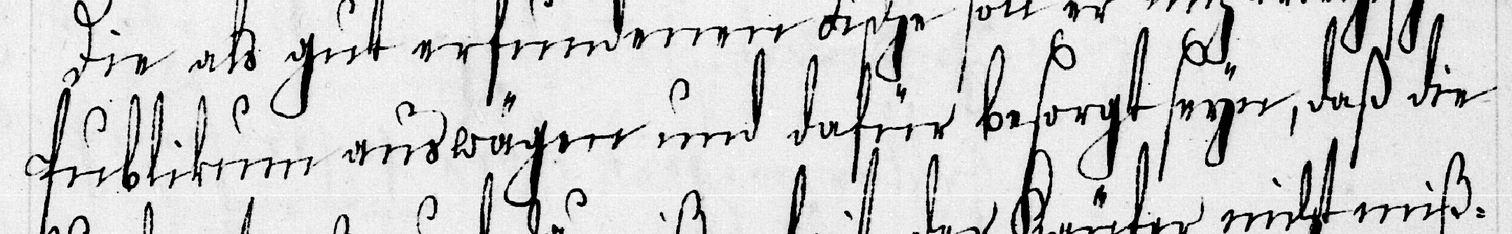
Publikum auswägen und dafür besorgt seyn, daß die
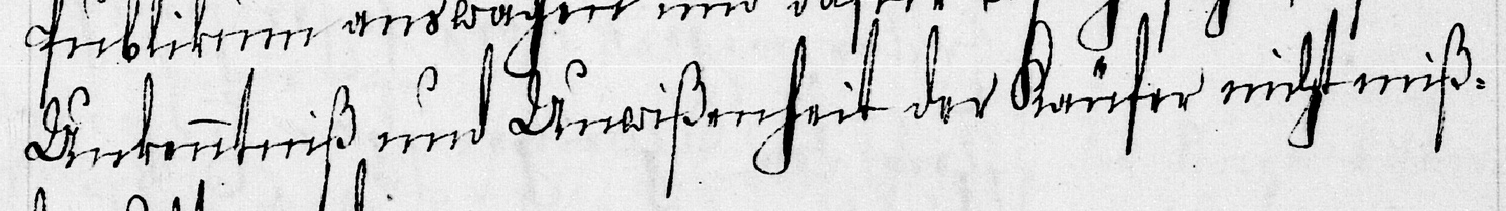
Unkenntniß und Unwißenheit der Käufer nicht miß¬
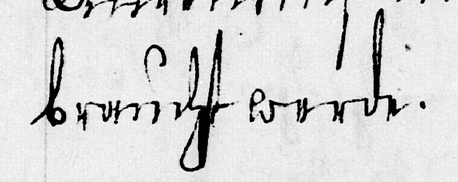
braucht werde.
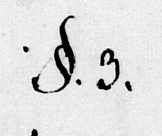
§. 3.
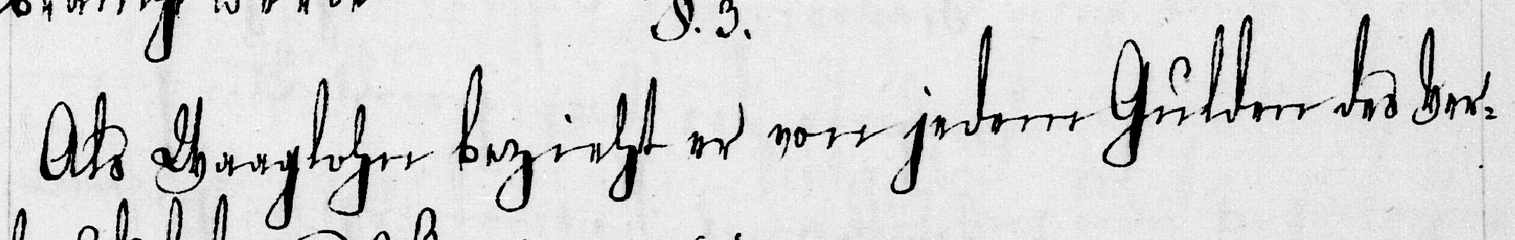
Als Waaglohn bezieht er von jedem Gulden des Ver¬
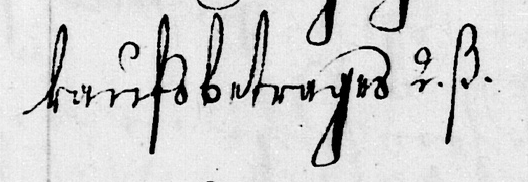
kaufsbetrages 2.ß.
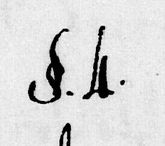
§. 4.
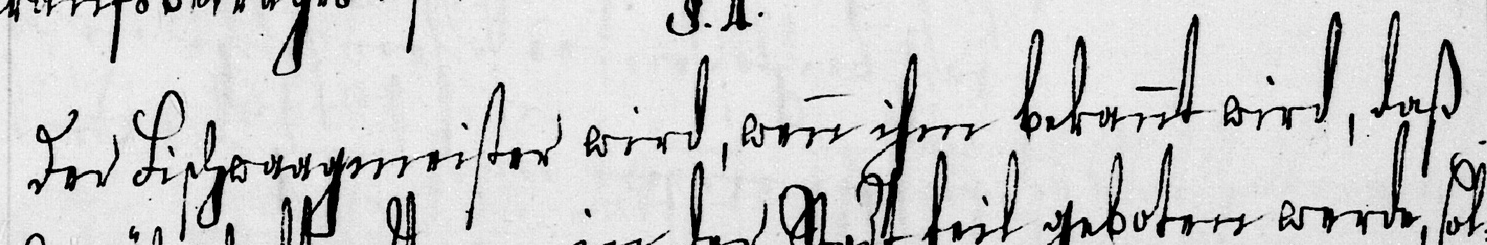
Der Fischwaagmeister wird, wenn ihm bekannt wird, daß
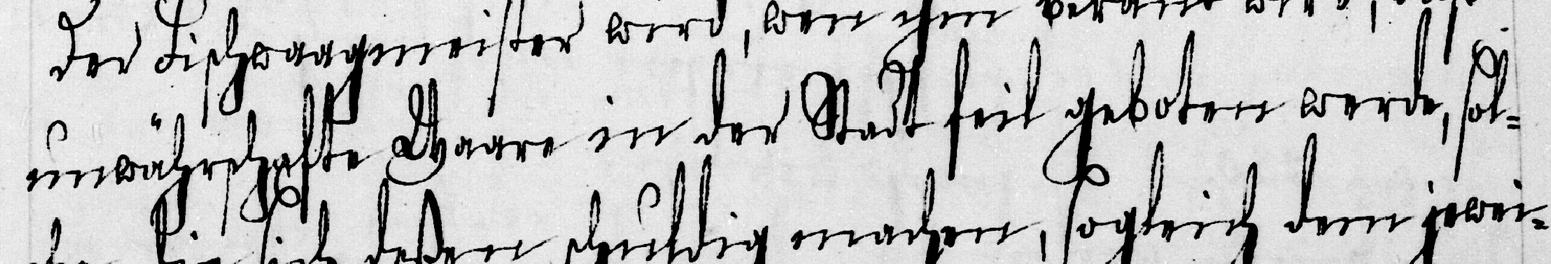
unwährschafte Waare in der Stadt feil geboten werde, sol¬
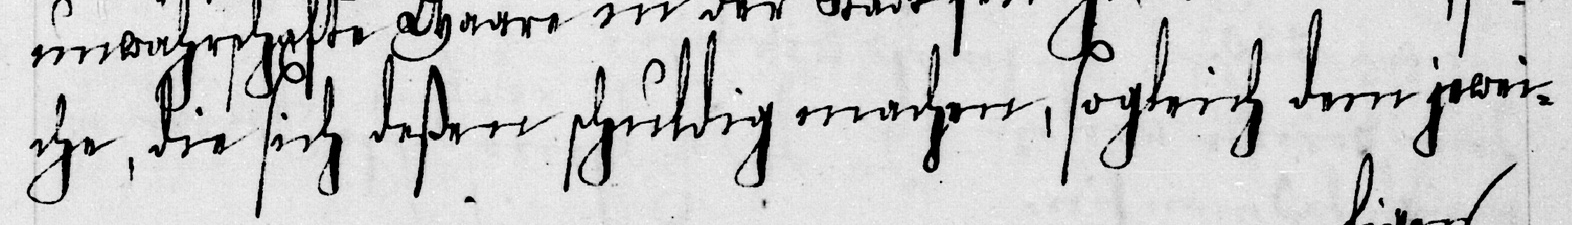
che, die sich deßen schuldig machen, sogleich dem jewei-
